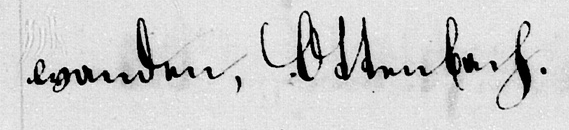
wanden, Ottenbach.
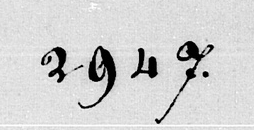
2947.
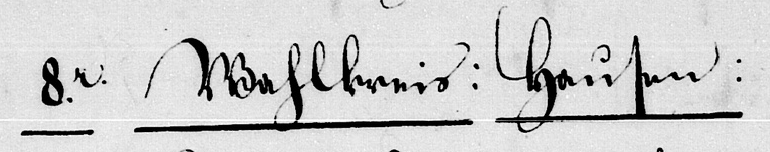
8.r. Wahlkreis: Hausen:
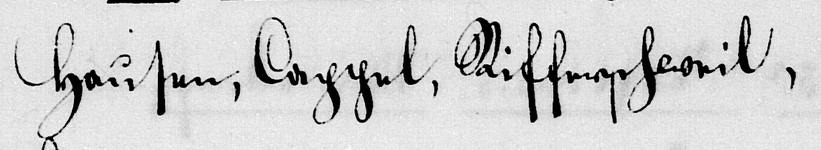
Hausen, Cappel, Rifferschweil,
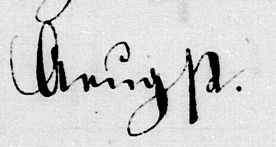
Augst.
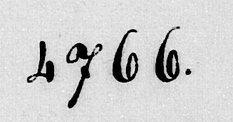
4766.
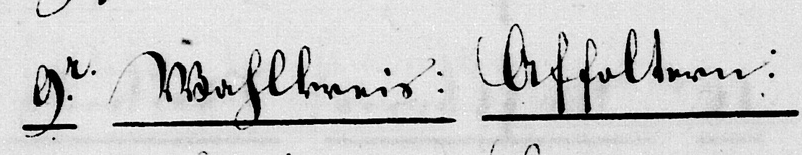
9.r. Wahlkreis: Affoltern:
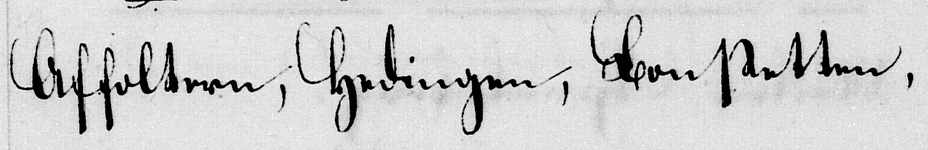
Affoltern, Hedingen, Bonstetten,
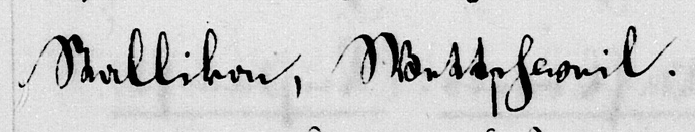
Stallikon, Wettschweil.
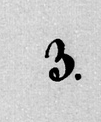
3.
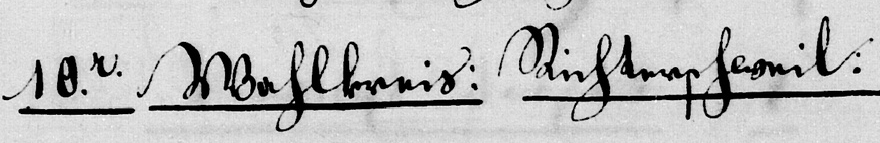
10.r. Wahlkreis: Richterschweil:
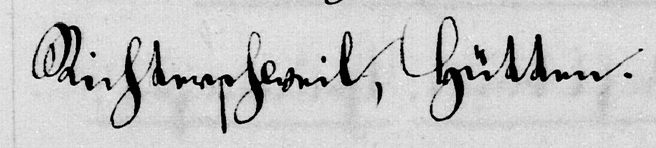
Richterschweil, Hütten.
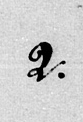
2.
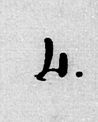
4.
